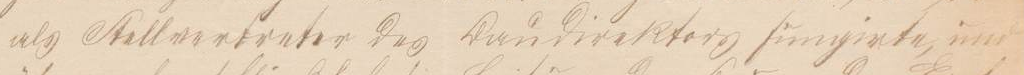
als Stellvertreter des Baudirektors fungirte, und
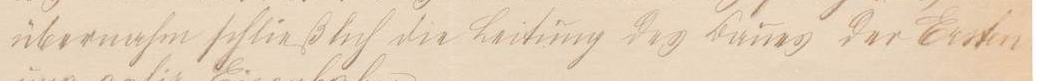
übernahm schließlich die Leitung des Baues der Ersten
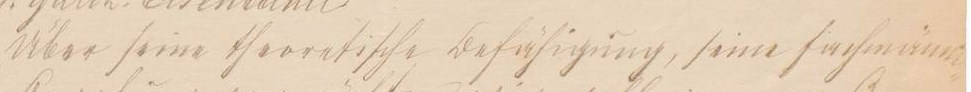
Über seine theoretische Befähigung, seine fachmänni-
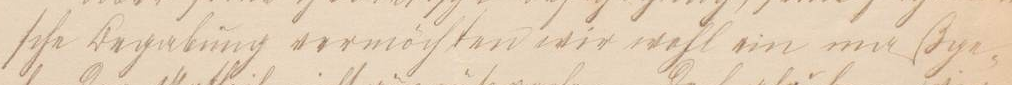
sche Begabung vermöchten wir wohl ein maßge-
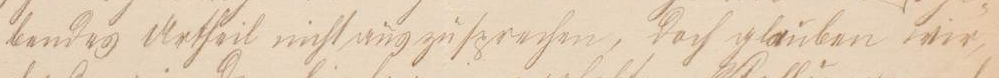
bendes Urtheil nicht auszusprechen, doch glauben wir,
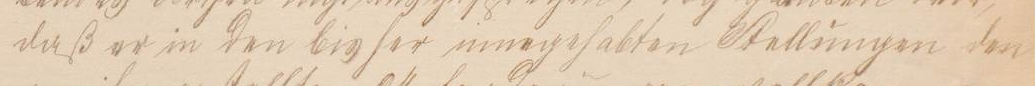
daß er in den bisher innegehabten Stellungen den
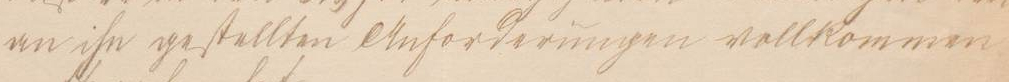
an ihn gestellten Anforderungen vollkomen
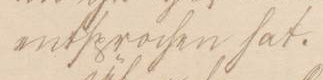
entsprochen hat.
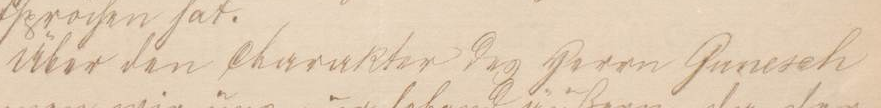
Über den Charakter des Herrn Gunesch
